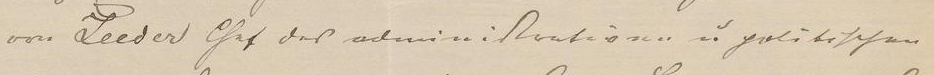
von Leeder Chef des administrativen u. politischen
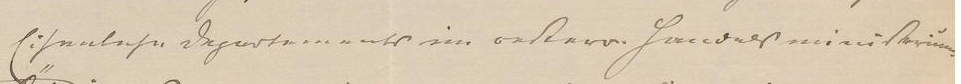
Eisenbahndepartements im oesterr. Handelsministerium.
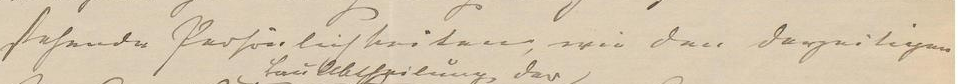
stehende Persönlichkeiten, wie den derzeitigen
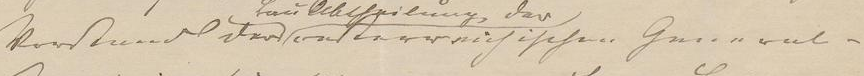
Vorstand der BauAbtheilung deroesterreichischen General-
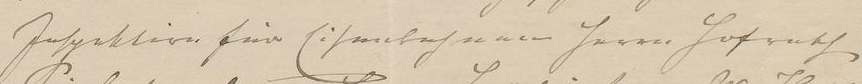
Inspektion für Eisenbahnen Herrn Hofrath
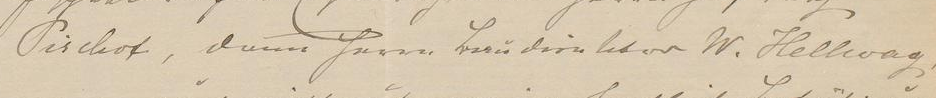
Pischof, dann Herrn Baudirektor W. Hellwag,
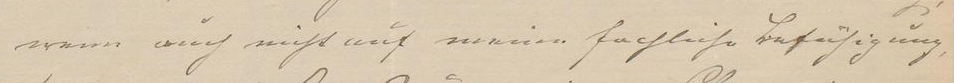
wenn auch nicht auf meine fachliche Befähigung,
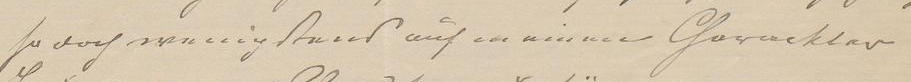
so doch wenigstens auf meinen Charackter
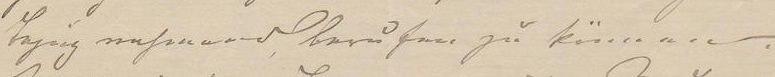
Bezug nehmend, berufen zu können. –
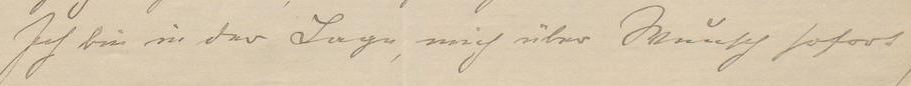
Ich bin in der Lage, mich über Wunsch sofort
